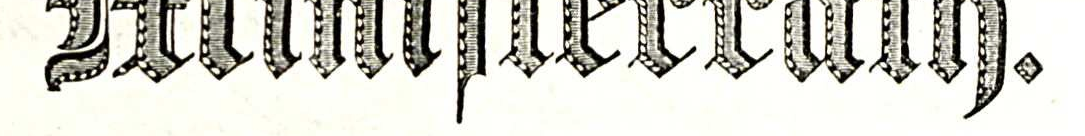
Ministerrath
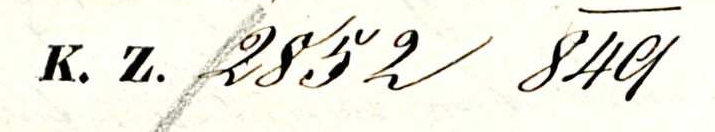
KZ 2852 849
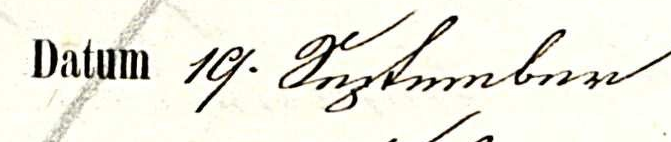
Datum 19. September
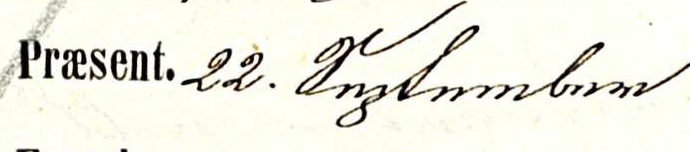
Praesent. 22. September
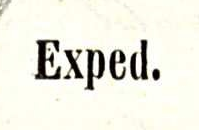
Exped.
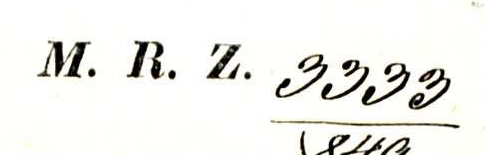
MRZ 3333/
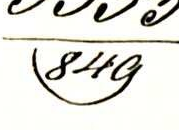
849
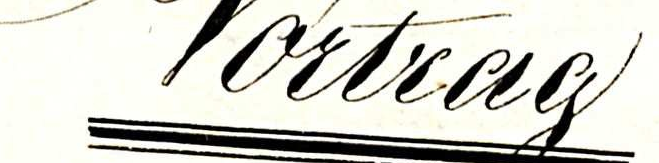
Vortrag
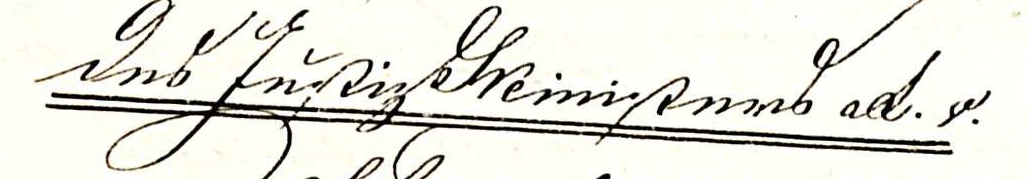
des Justiz Ministers R. v.
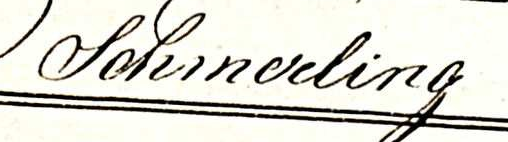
Schmerling
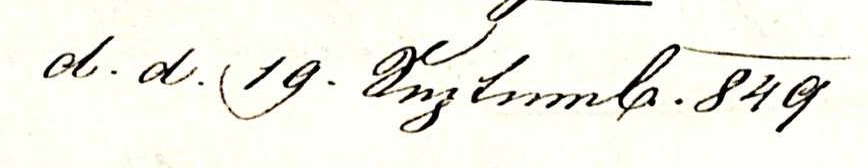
d.d. 19. Septemb. 849
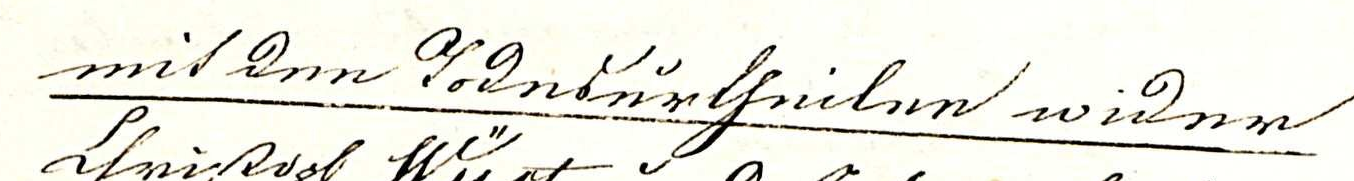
mit den Todesurtheilen wider
